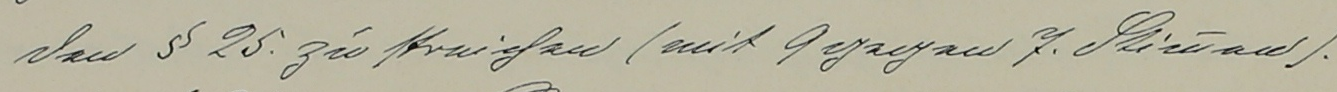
den § 25. zu streichen (mit 9 gegen 7. Stimmen).
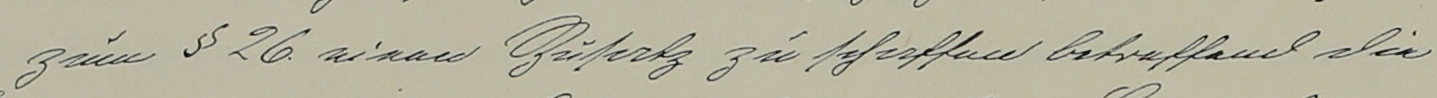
zum § 26. einen Zusatz zu schaffen betreffend die
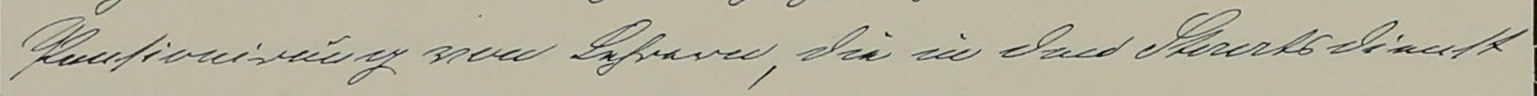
Pensionirung von Lehrern, die in den Staatsdienst
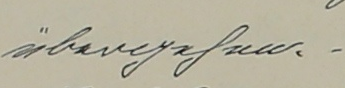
übergehen.
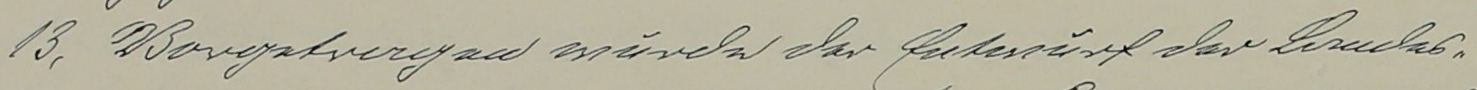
13. Vorgetragen wurde der Entwurf der Landes-
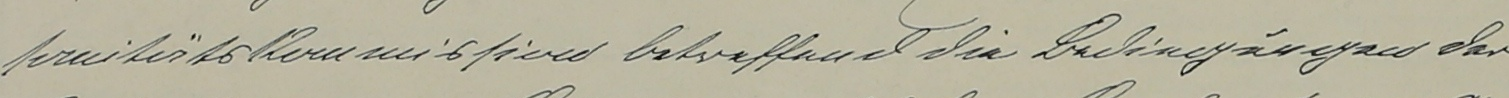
sanitätskommission betreffend die Bedingungen der
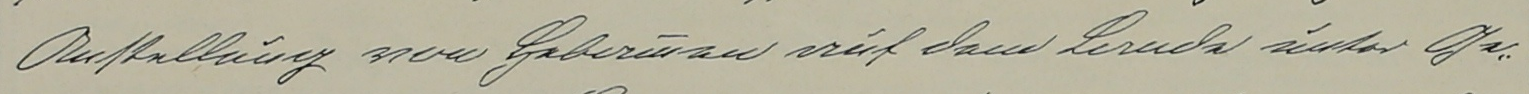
Anstellung von Hebammen auf dem Lande unter Ge-
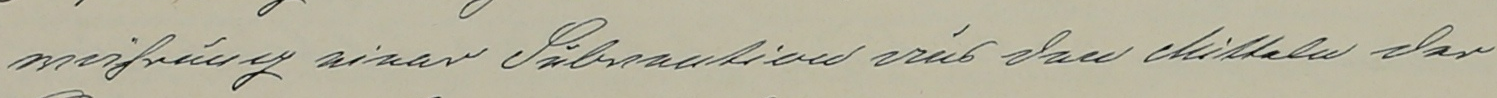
währung einer Subvention aus den Mitteln der
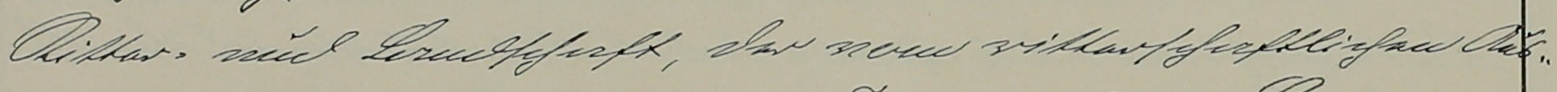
Ritter- und Landschaft, der vom ritterschaftlichen Aus-
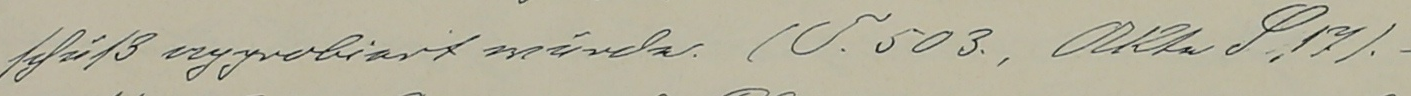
schuß approbiert wurde. (T.503; Akte S.17).
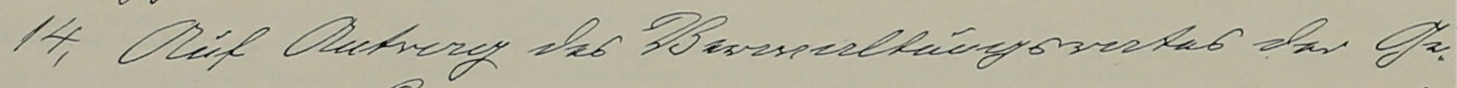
14. Auf Antrag des Verwaltungsrates der Ge-
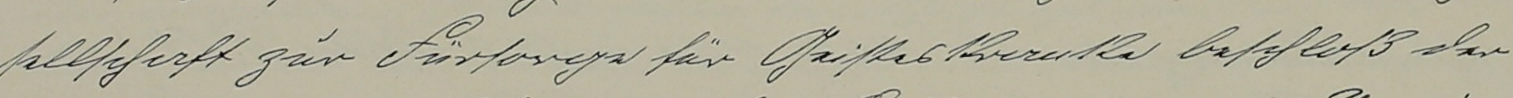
sellschaft zur Fürsorge für Geisteskranke beschloß der
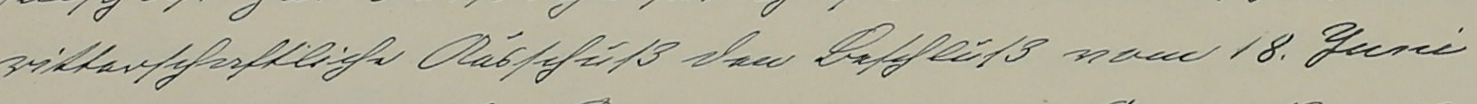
ritterschaftliche Ausschuß den Beschluß vom 18. Juni
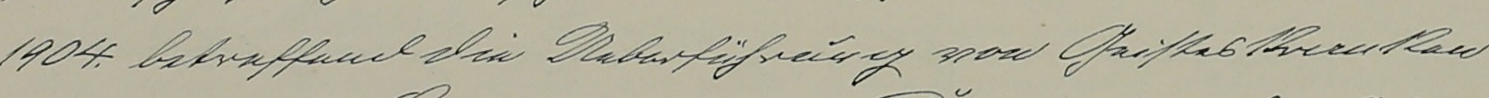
1904. betreffend die Ueberführung von Geisteskranken
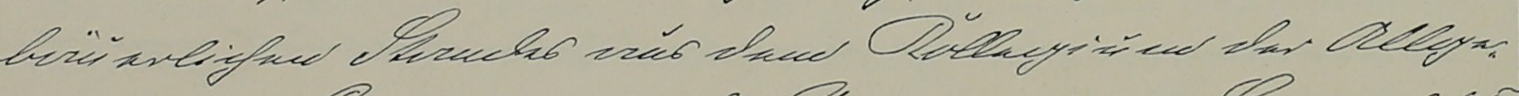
bäuerlichen Standes aus dem Kollegium der Allge-
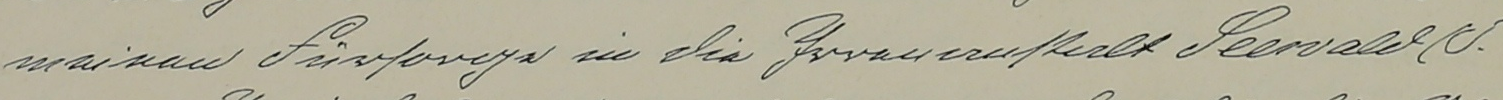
meinen Fürsorge in die Irrenanstalt Seewald (T.
